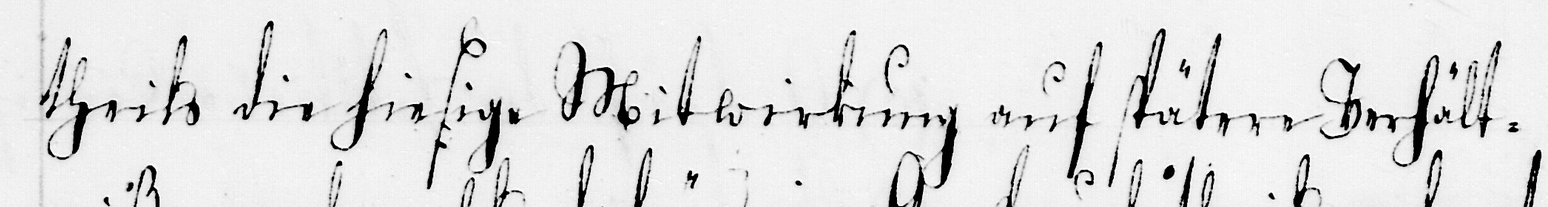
theils die hiesige Mitwirkung auf spätere Verhält¬
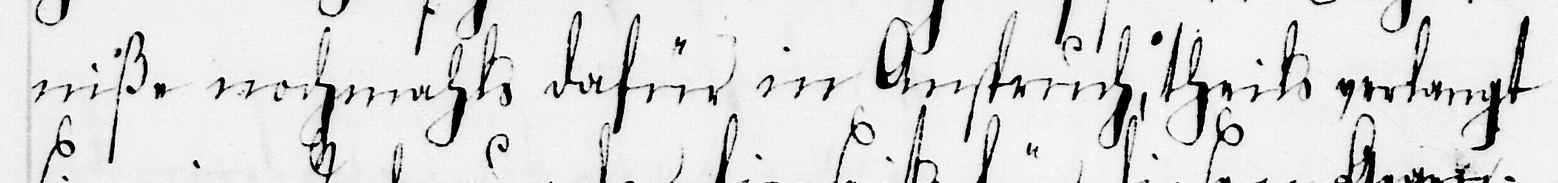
niße nochmahls dafür in Anspruch, theils verlangt
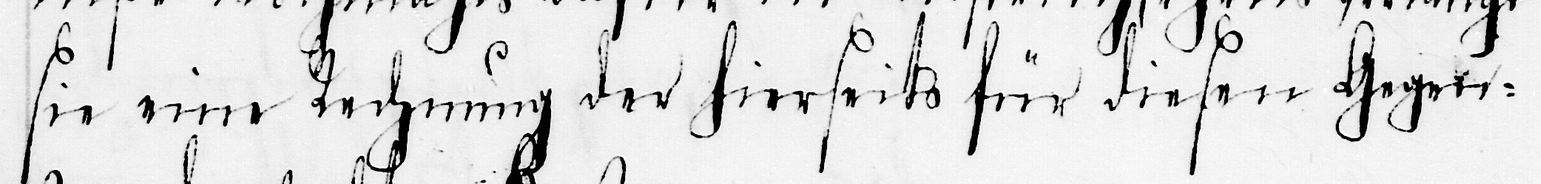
sie eine Rechnung der hierseits für diesen Gegen¬
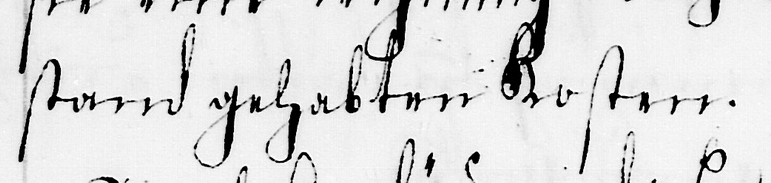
stand gehabten Kosten.
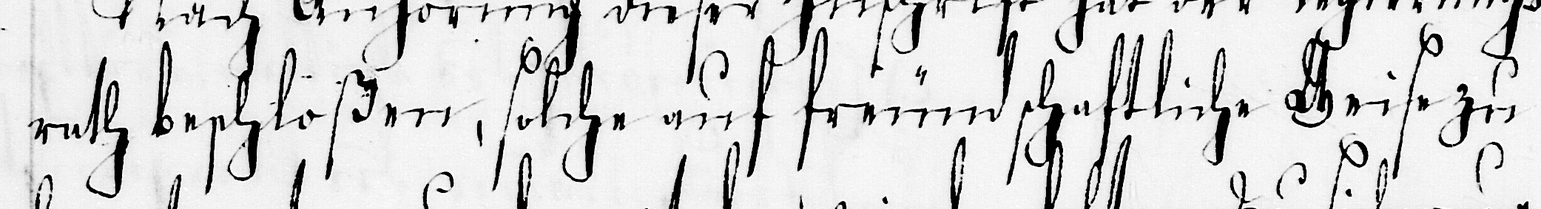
rath beschloßen, solche auf freundschaftliche Weise zu
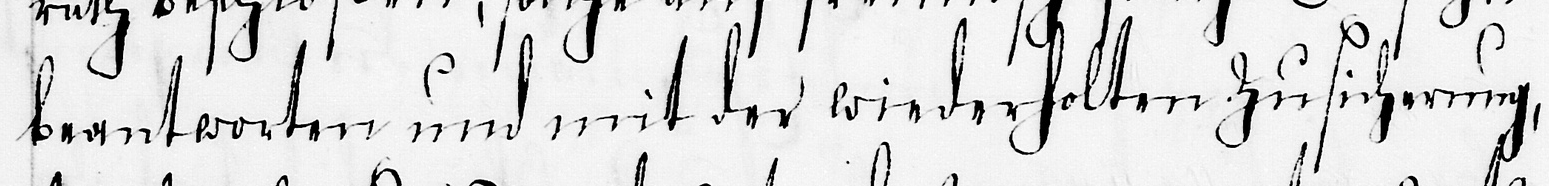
beantworten und mit der wiederholten Zusicherung,
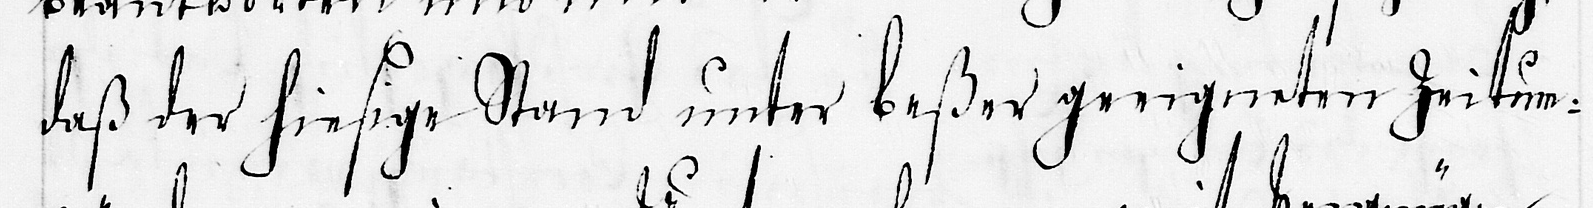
daß der hiesige Stand unter beßer geeigneten Zeitum¬
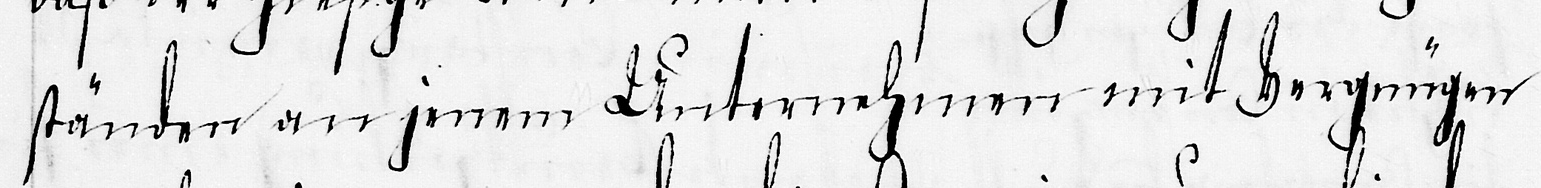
ständen an jenem Unternehmen mit Vergnügen
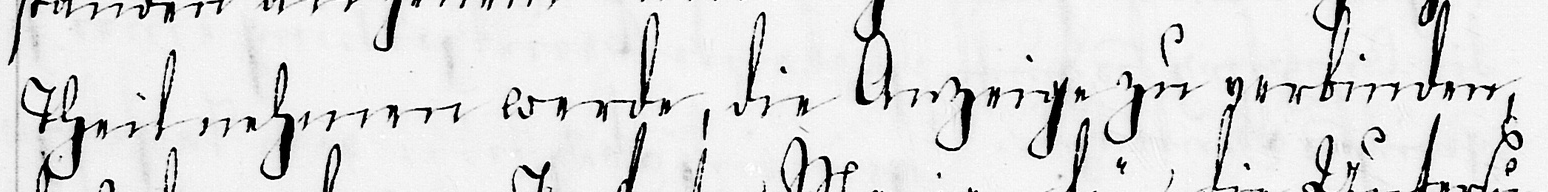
Theil nehmen werde, die Anzeige zu verbinden,
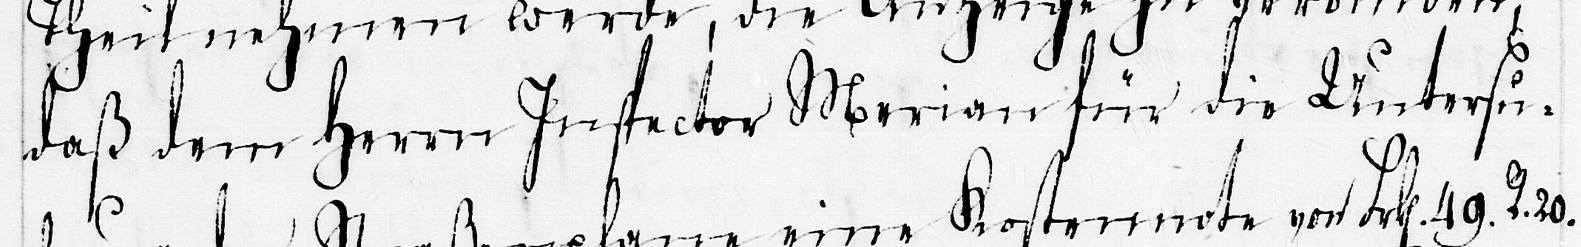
daß dem Herrn Inspector Merian für die Untersu¬
